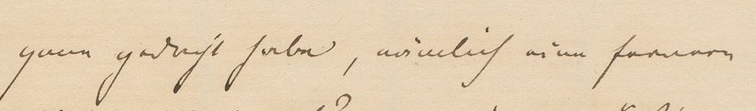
gene gedacht habe, nämlich eine fernere
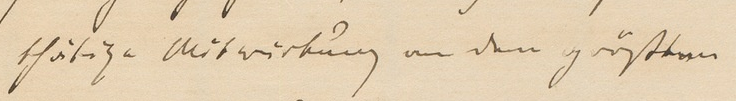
thätige Mitwirkung an dem größten
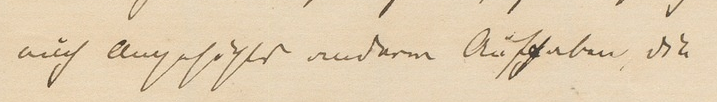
mich Angesichts anderer Aufgaben, die
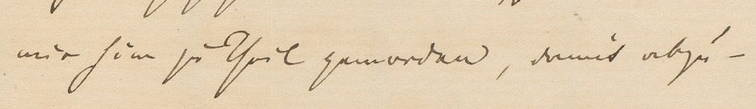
mir hier zu Theil geworden, damit abzu-
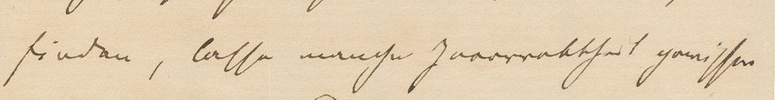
finden, lasse manche Incorrektheit gewissen
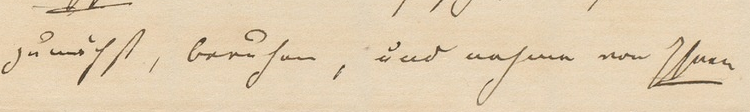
zunächst, beruhen, und nehme von Ihnen
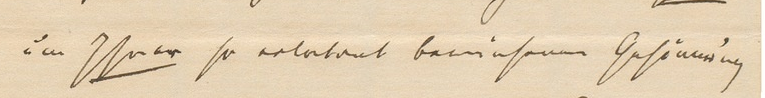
um Ihrer so eclatant bewiesenen Gesinnung
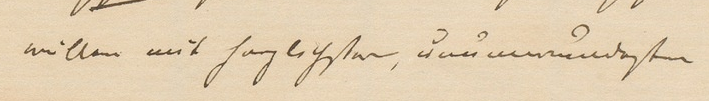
willen mit herzlichster, unumwundenster
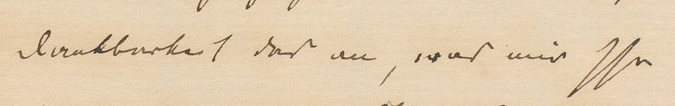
Dankbarkeit das an, was mir Ihr
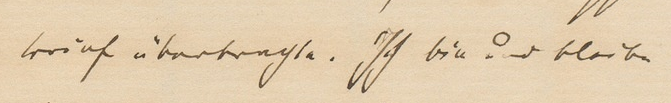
Brief überbrachte. Ich bin und bleibe
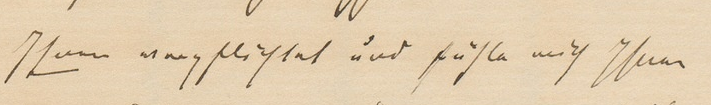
Ihnen verpflichtet und fühle mich Ihnen
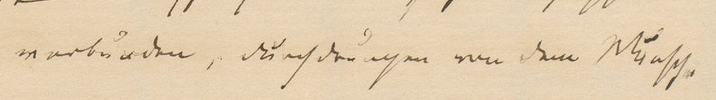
verbunden, durchdrungen von dem Wunsche
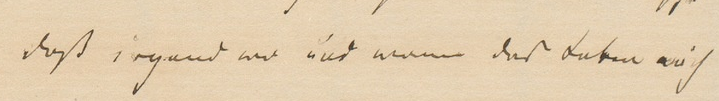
daß irgendwo und wann das Leben mich
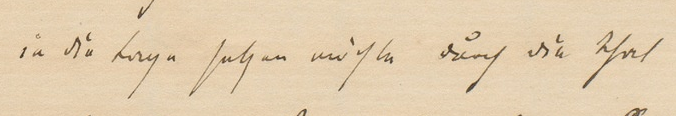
in die Lage setzen möchte durch die That
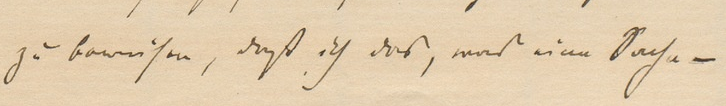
zu beweisen, daß ich das, was eine Sache –
